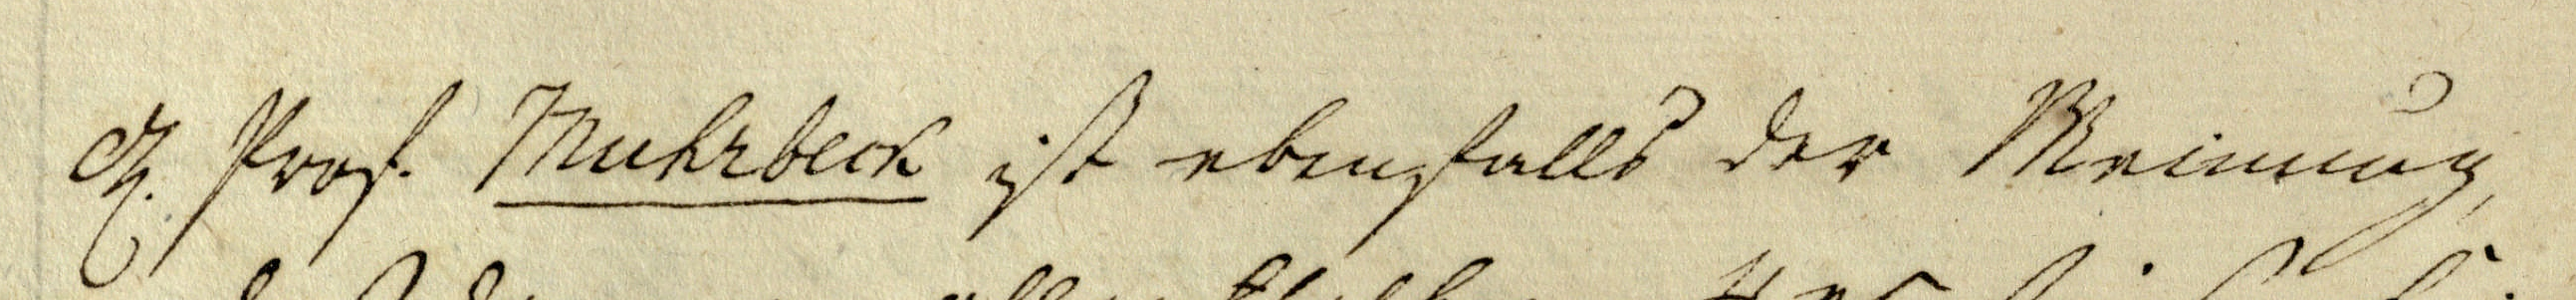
dh. Prof. Muhrbeck ist ebenfalls der Meinung,
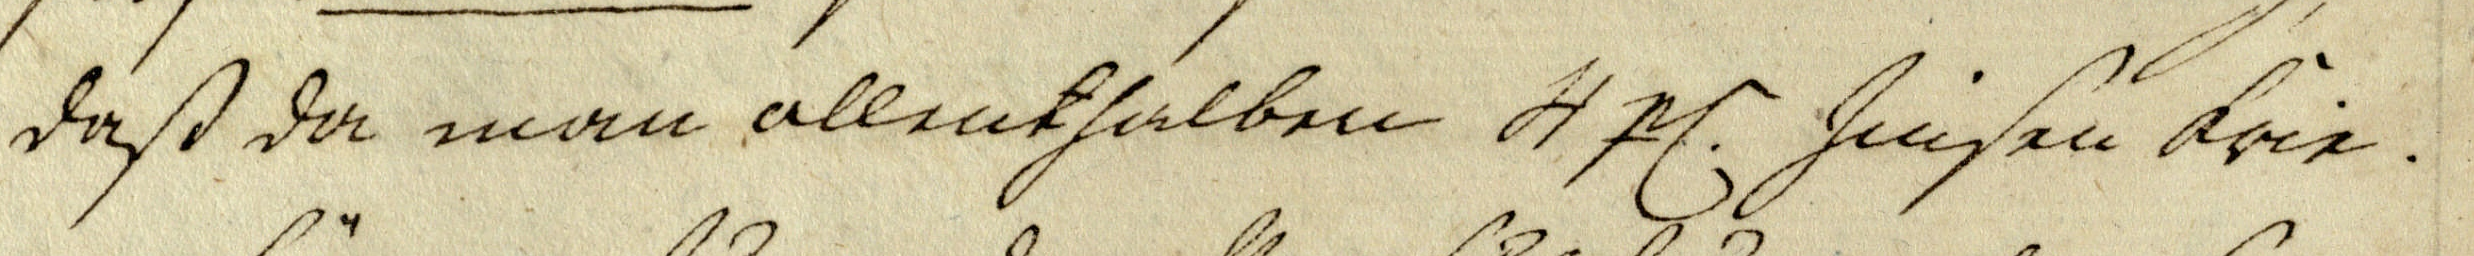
daß da man allenthalben 4 pl. Zinsen krie¬
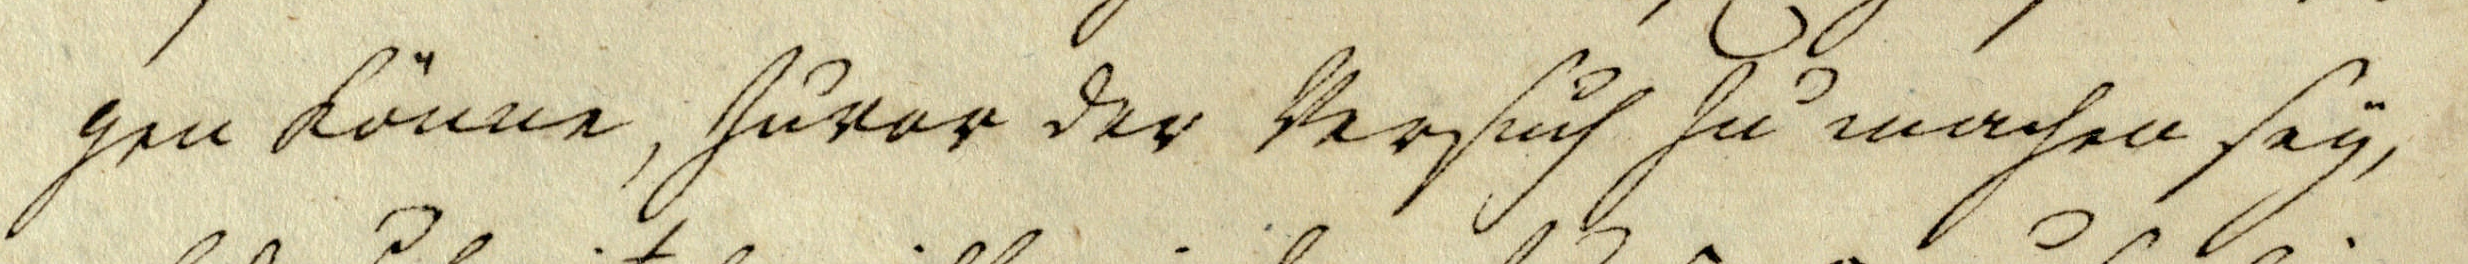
gen könne, zuvor der Versuch zu machen seÿ,
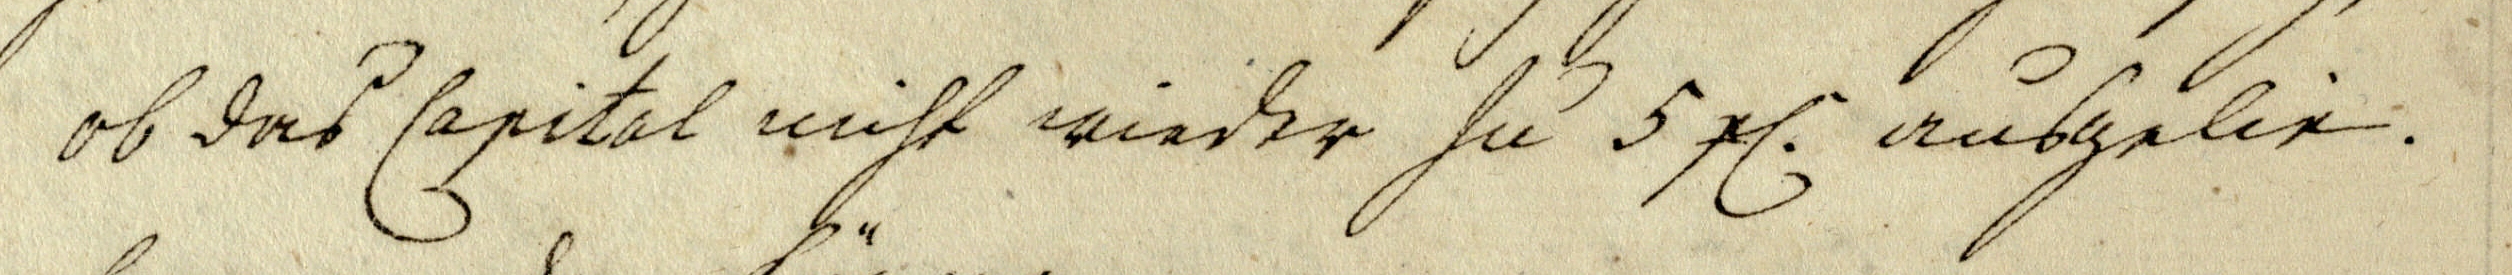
ob das Capital nicht wieder zu 5 pl. ausgelie¬
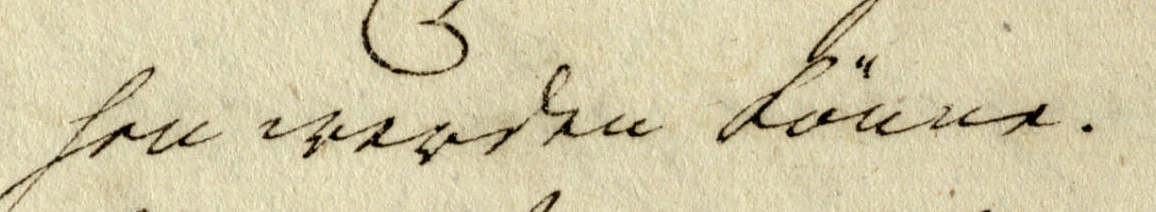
hen werden könne.
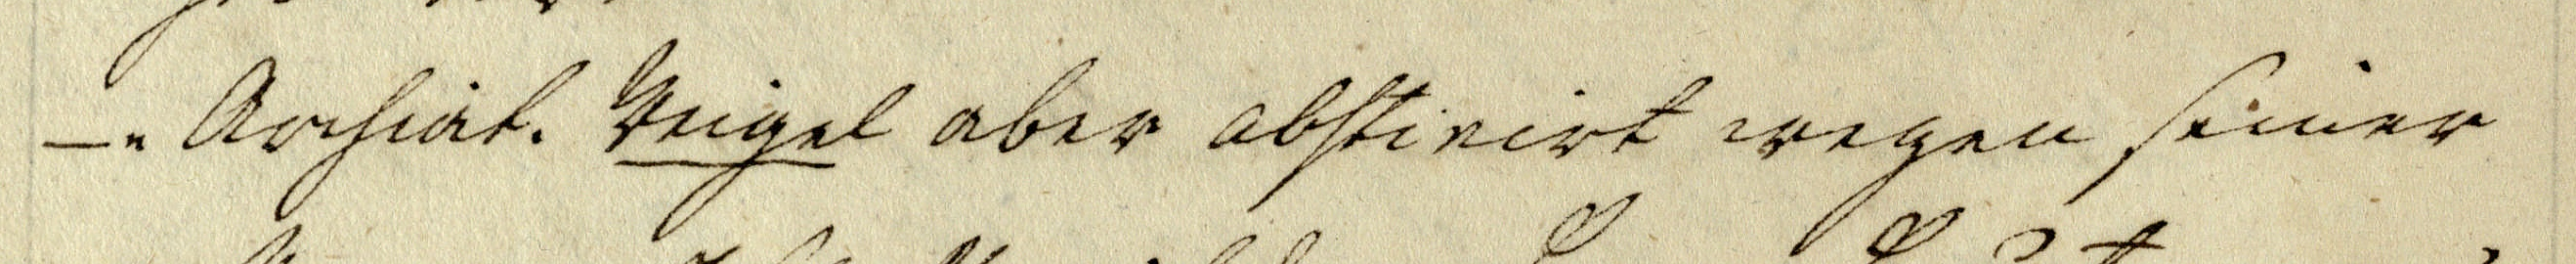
Archiat. Weigel aber abstinirt wegen seiner
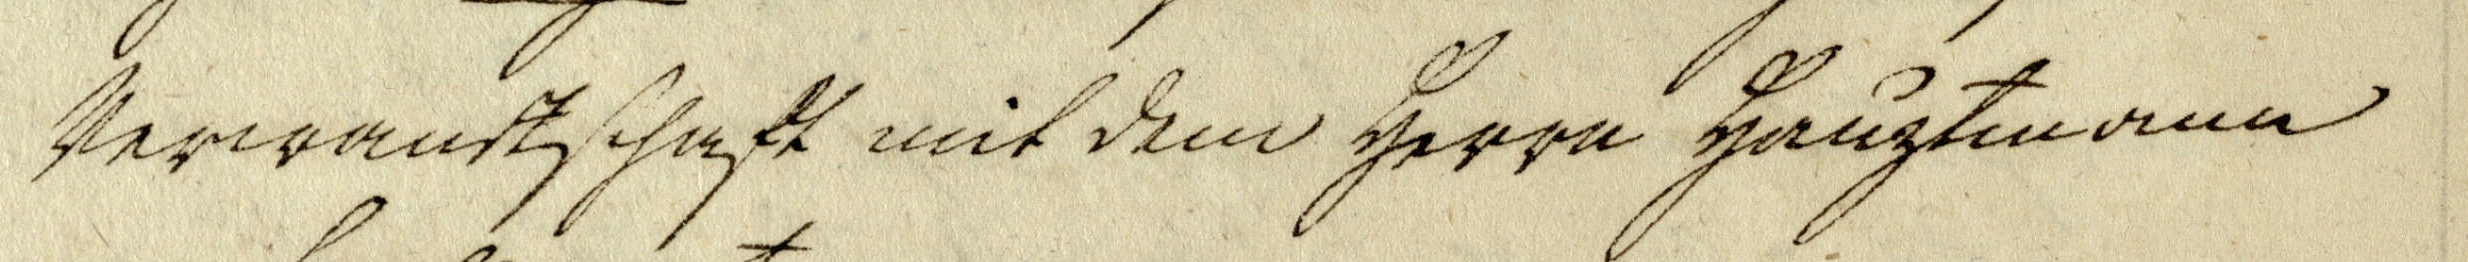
Verwandtschaft mit dem Herrn Hauptmann
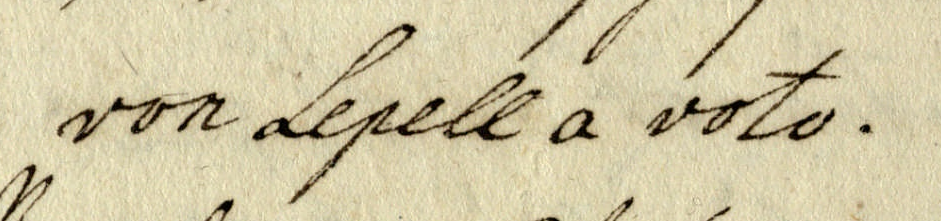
von Lepell a voto.
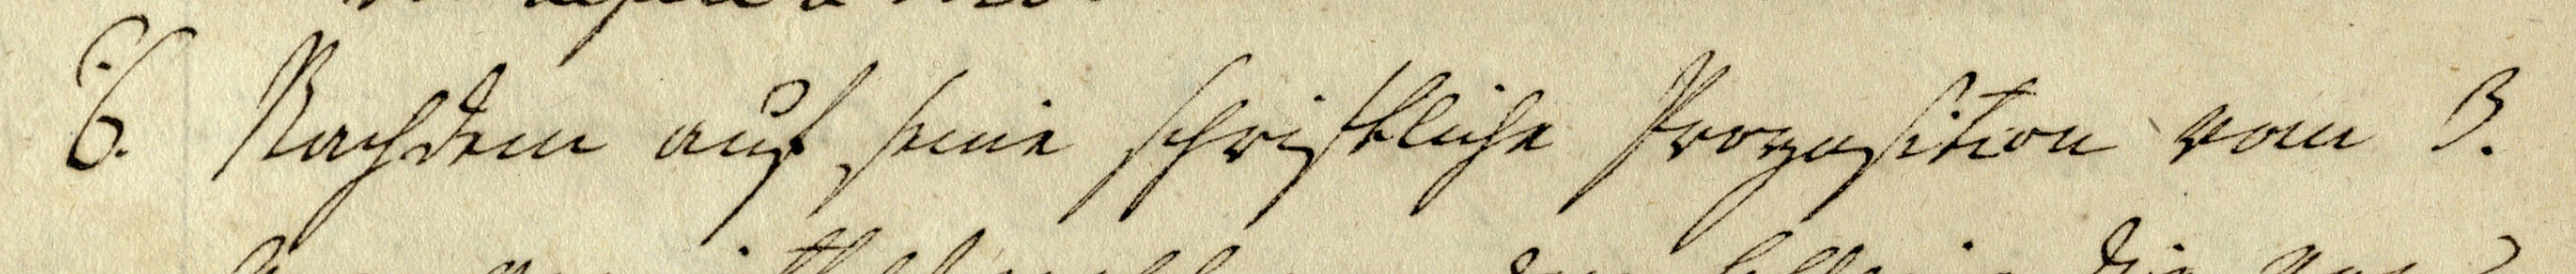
6. Nachdem auf seine schriftliche Proposition vom 3.
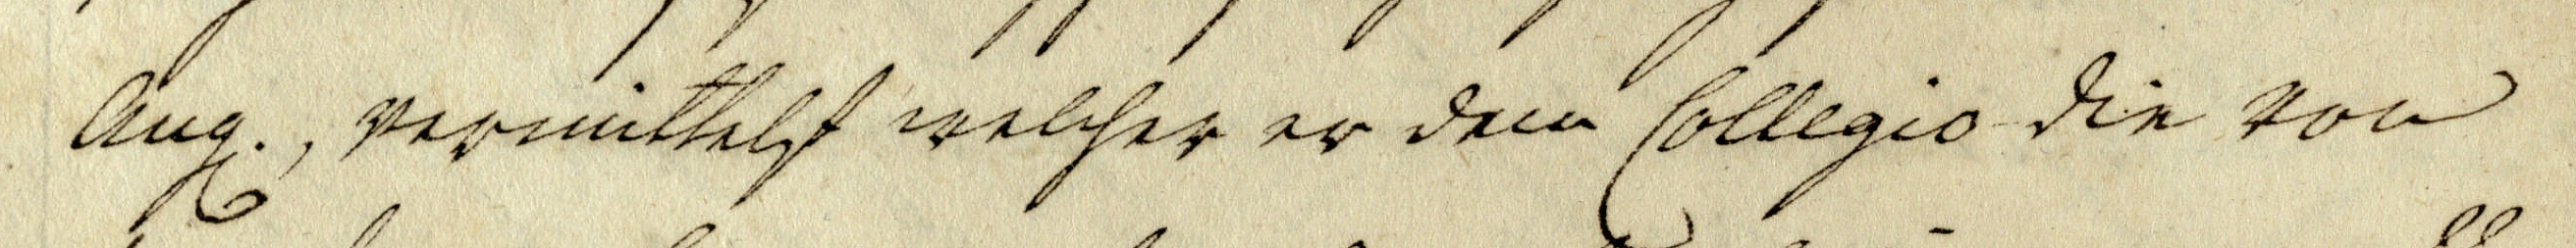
Aug., vermittelst welcher er dem Collegio die von
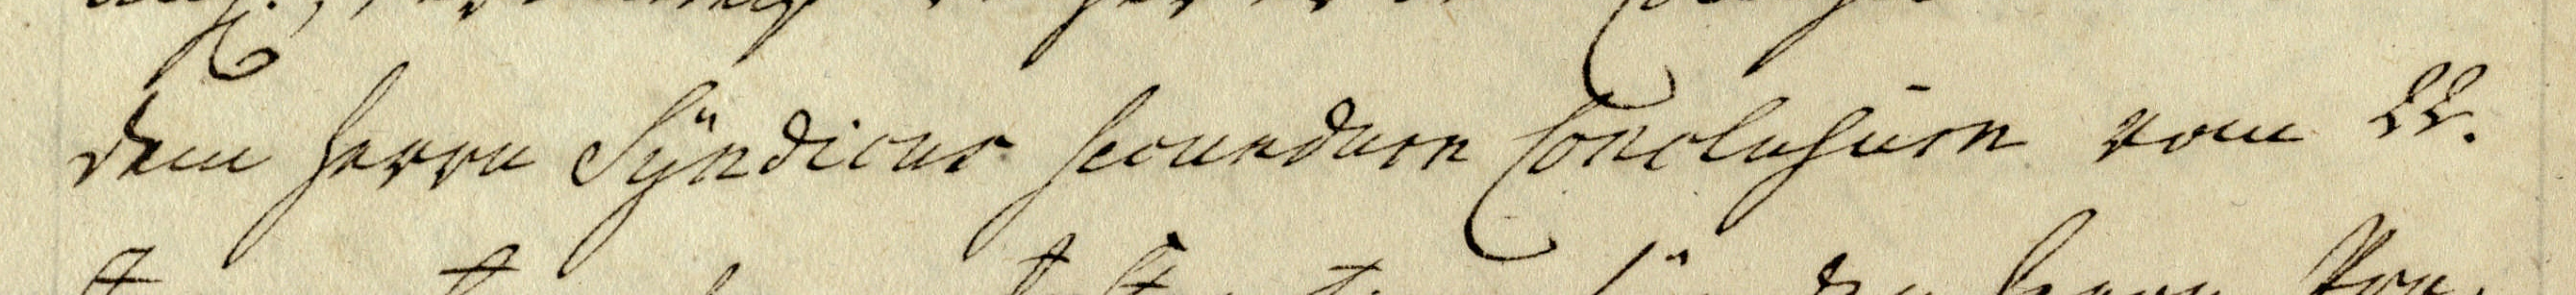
dem Herrn Sÿndicus secundum Conclusum vom 22.
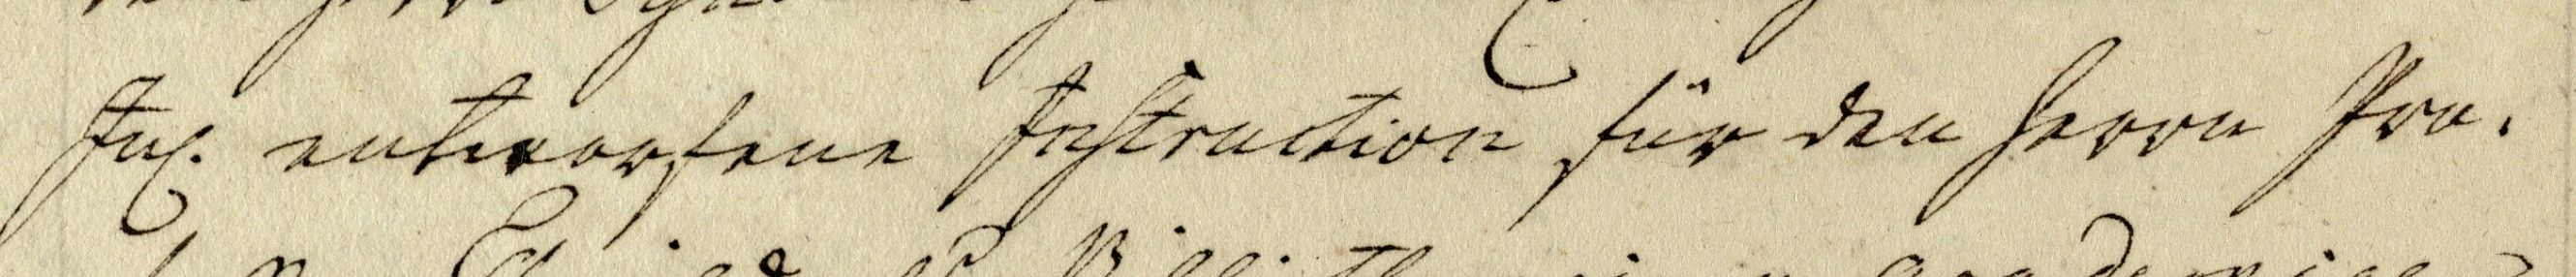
Jul. entworfene Instruction für den Herrn Pro¬
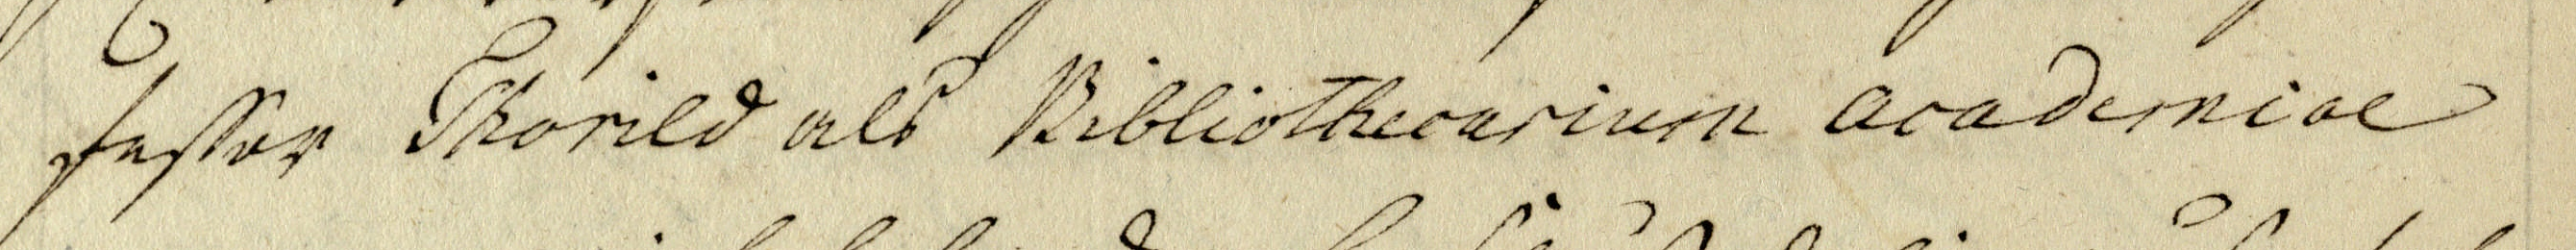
fessor Thorild als Bibliothecarium Academiae
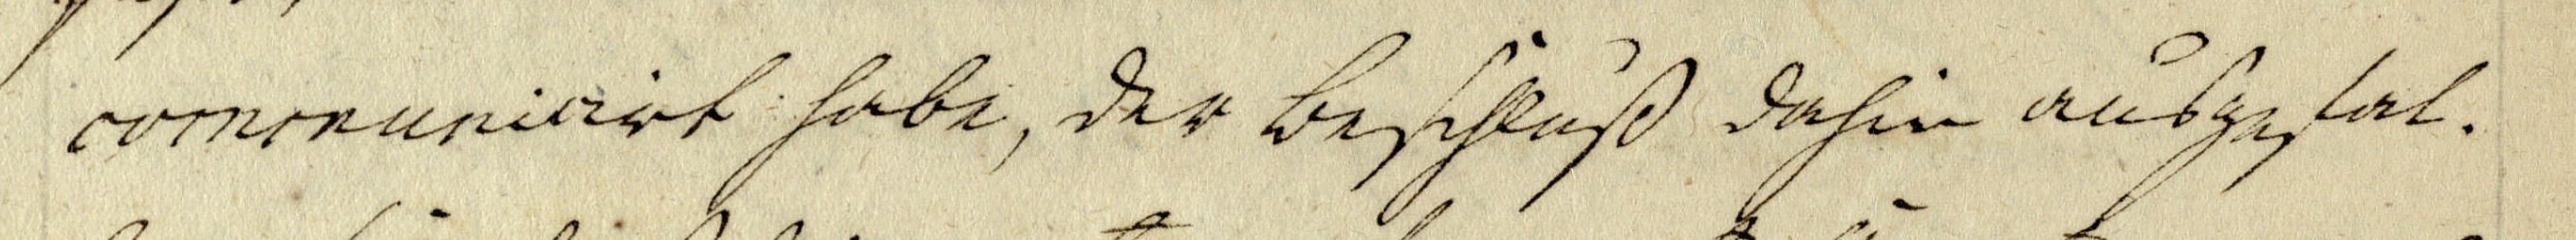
communicirt habe, der Beschluß dahin ausgefal¬
